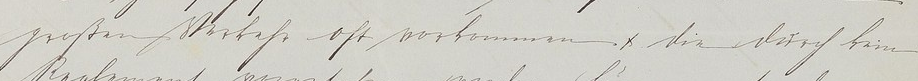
großen Verkehr oft vorkommen & die durch kein
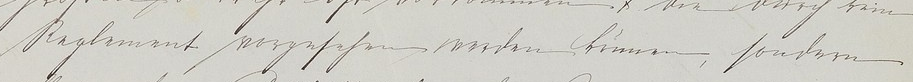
Reglement vorgesehen werden können, sondern
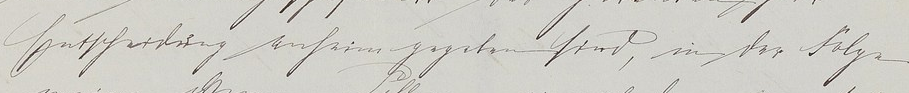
Entscheidung anheim gegeben sind, in der Folge
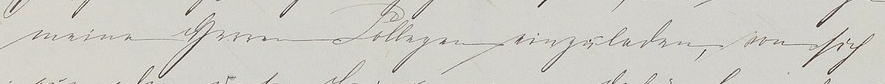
meine Herren Collegen einzuladen, von sich
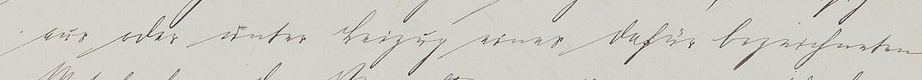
aus oder unter Beizug eines dafür bezeichneten
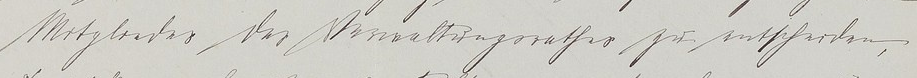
Mitgliedes des Verwaltungsrathes zu entscheiden,
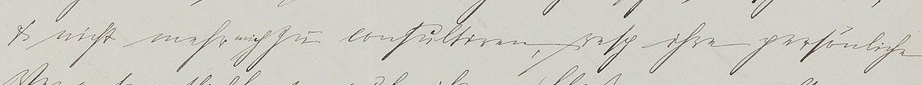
& nicht mehr mich zu consultiren, resp ihre persönliche
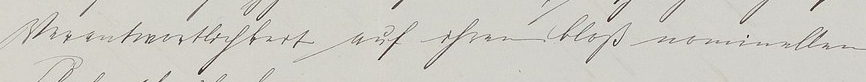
Verantwortlichkeit auf ihren bloß nominellen
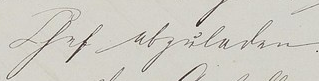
Chef abzuladen. –
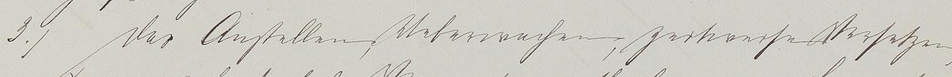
3.) Das Anstellen, Ueberwachen, zeitweise Versetzen,
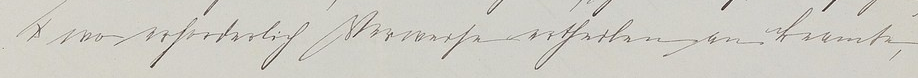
& wo erforderlich Verweise ertheilen an Beamte,
